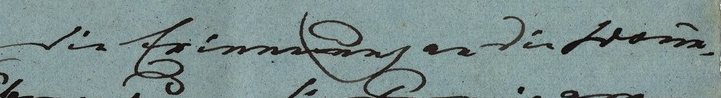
Die Erinnerung an die wonne-
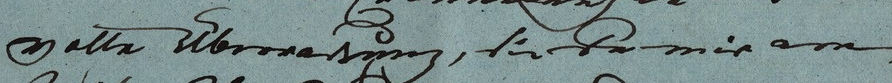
volle Überraschung, die Du mir am
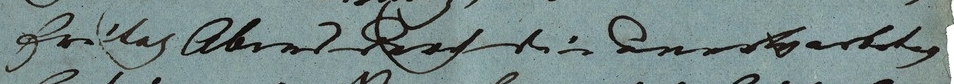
Freitag Abend durch Dein unerwartetes
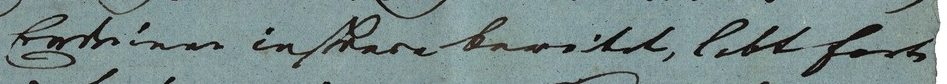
Erscheinen in Bern bereitet, lebt fort
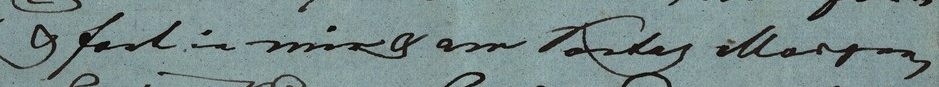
& fort in mir & am Sontag Morgen,
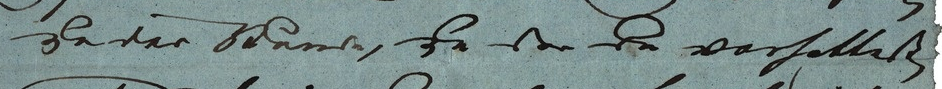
zu der Stunde, zu der Du vorhattest,
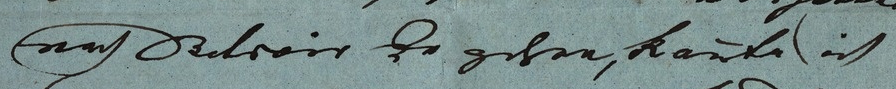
nach Belvoir zu gehen, konnte ich
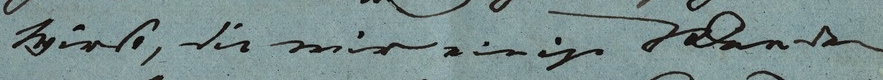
wirst, die mir einige Stunden
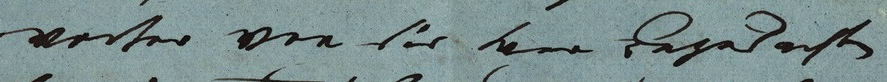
vorher von dir war zugedacht
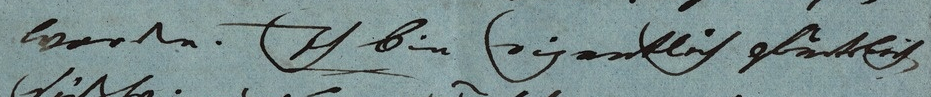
worden. Ich bin eigentlich glücklich,
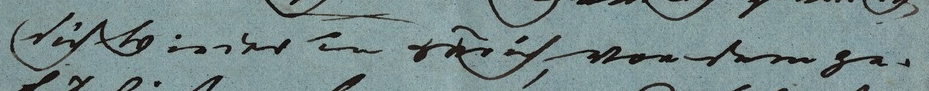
dich wieder in Zürich, von dem ge-
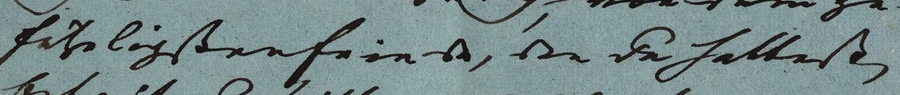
fährlichsten Feinde, den Du hattest,
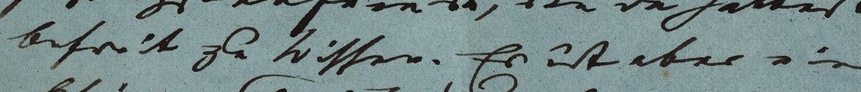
befreit zu wissen. Es ist aber ein
